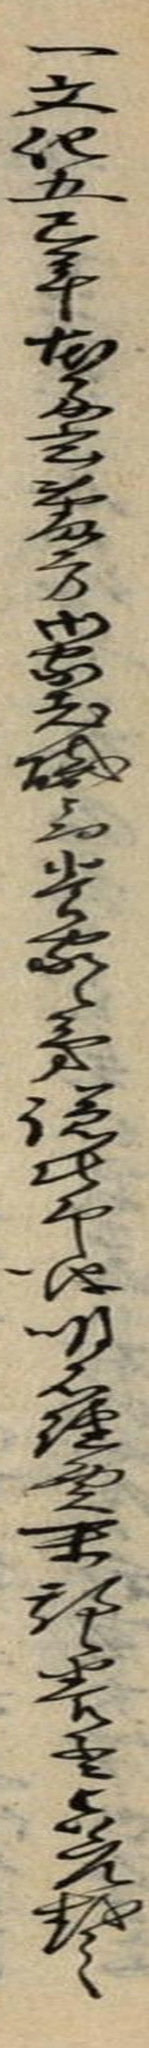一文化五巳年本多玄蕃方御家老職ニ而養家之弟謙次郎儀明石縫殿末期之養子ニ被差越之
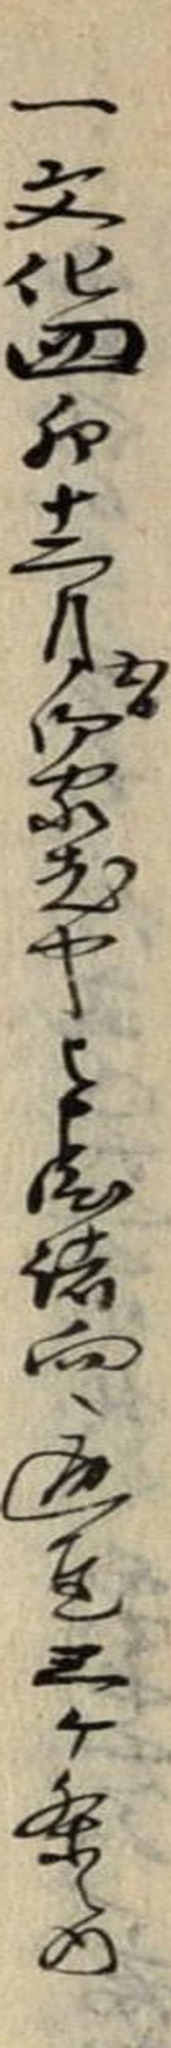一文化四卯十二月五日御家老中被申渡諸向へ通達三ケ条之内
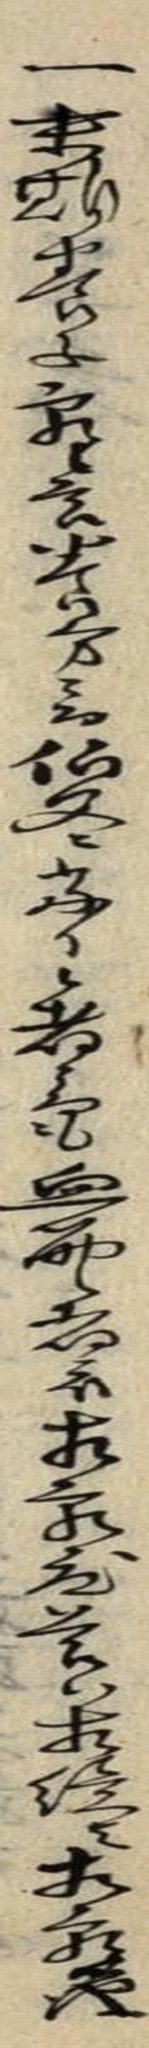一末期養子願之節養方ニ而伯父ニ当り候者ニ付相願度節ハ相続与相願候儀
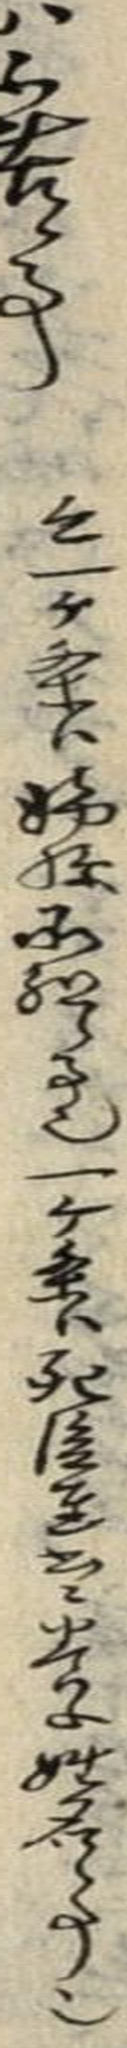ハ不苦候事今一ケ条ハ嫡孫承祖之事也一ケ条ハ死後達書ニ養子姓名之事也
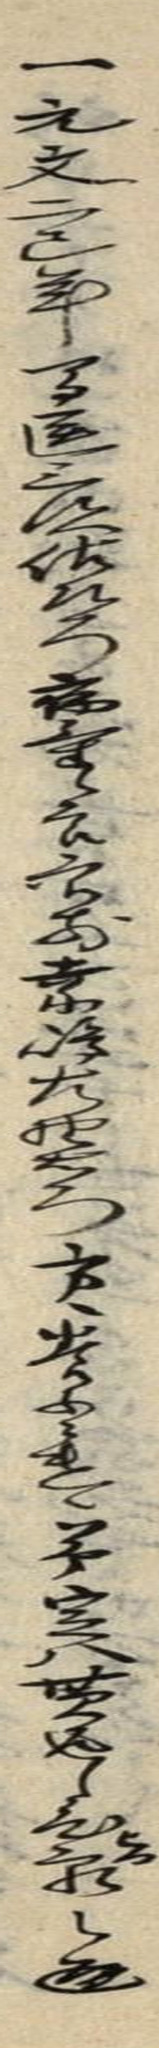一元文二巳年馬医三沢佐左衛門病気之節最前桑島左野右衛門方へ養子ニ遣候弟定八貰返し度旨願之通
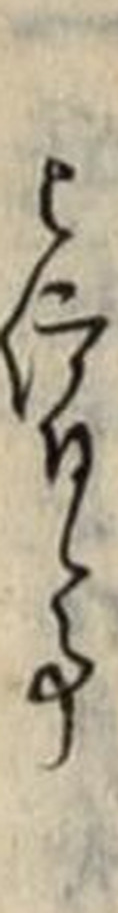被仰付候事
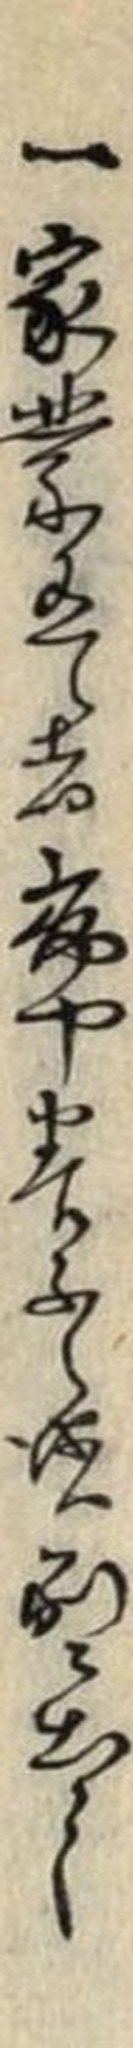一家業有之者病中養子之儀ハ別ニ出之
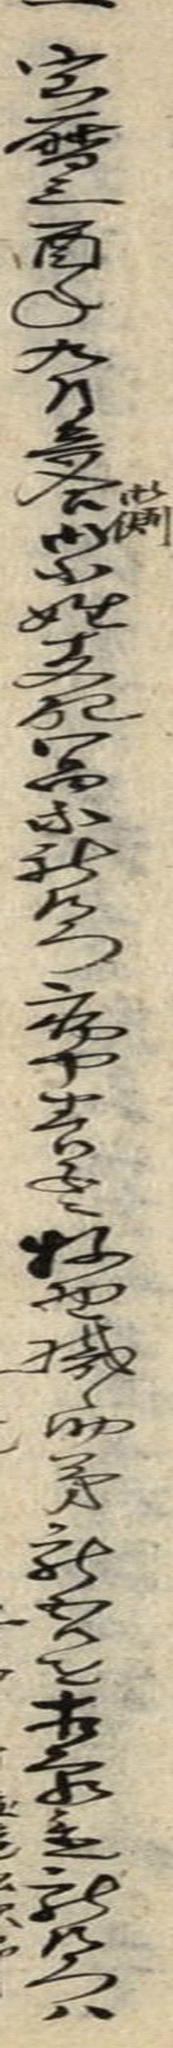一宝暦三酉年九月寄合御側御小姓支配富永新左衛門病中養子ニ牧野織之助弟新吾を相願置新左衛門ハ
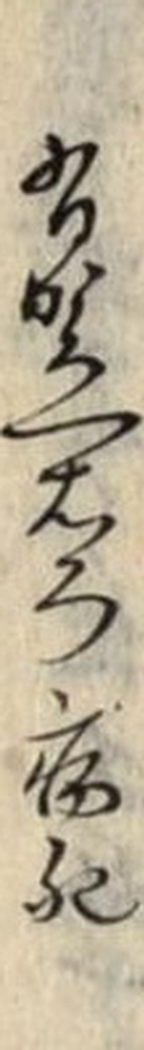一有賀一右衛門病死
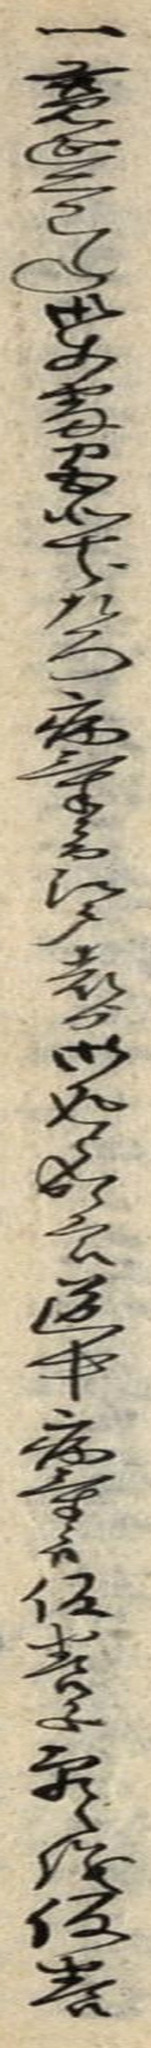一寛延二巳年御使番宮北十郎左衛門病気ニ而江戸表ゟ御返被成候節道中病気ニ付仮養子願候儀仮養
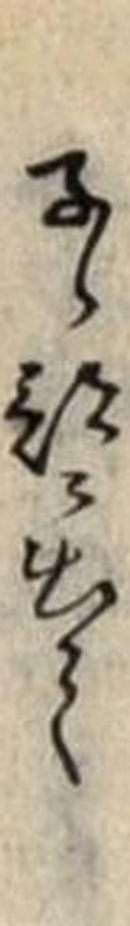子之部ニ出之

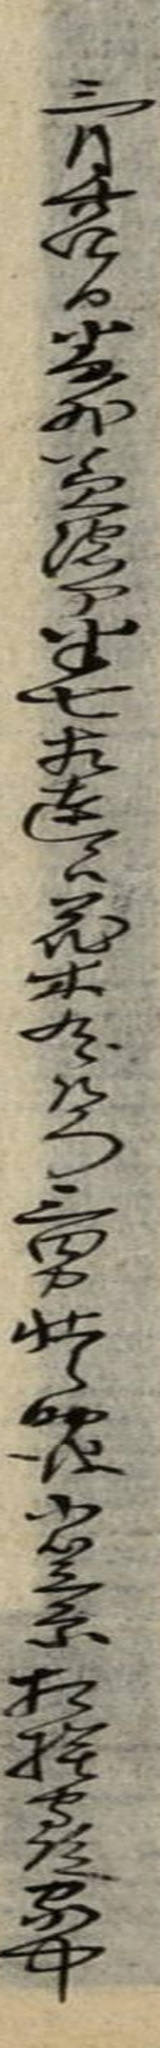三月廿四日番外美濃部半七相達候ハ花木九郎左衛門三男壮之助儀小笠原相模守殿家中
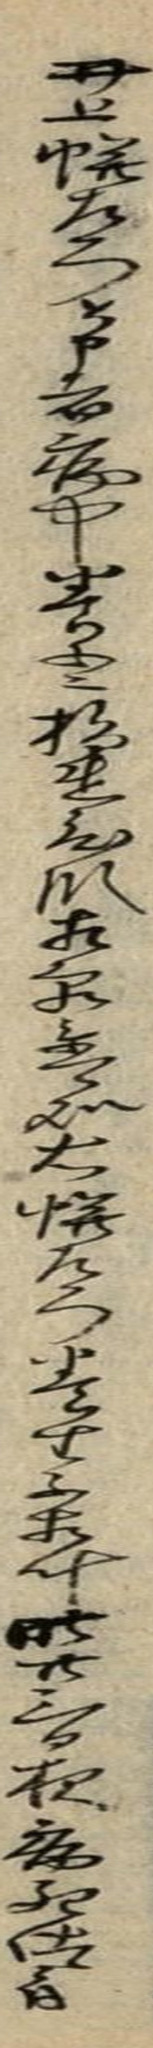井上帲左衛門と申者病中養子ニ指遣度段相願置候処右帲左衛門養生不相叶昨廿三日夜病死仕候ニ付
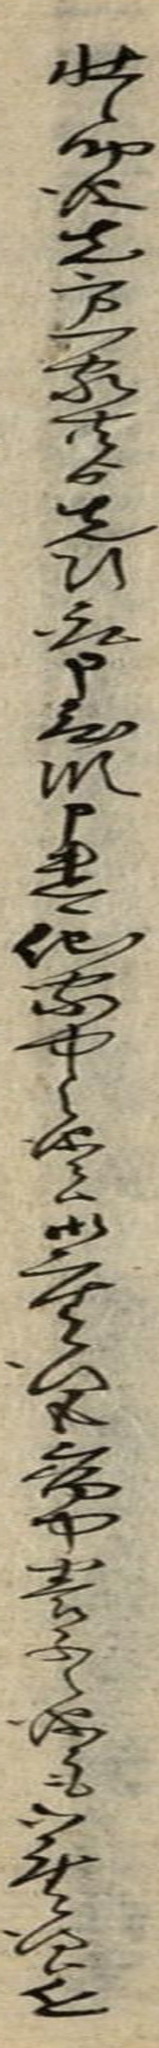壮之助儀先方一家共ゟ先引取度段申遣候他家中之儀ニハ御座候得共病中養子之儀ニも御座候得ハ近
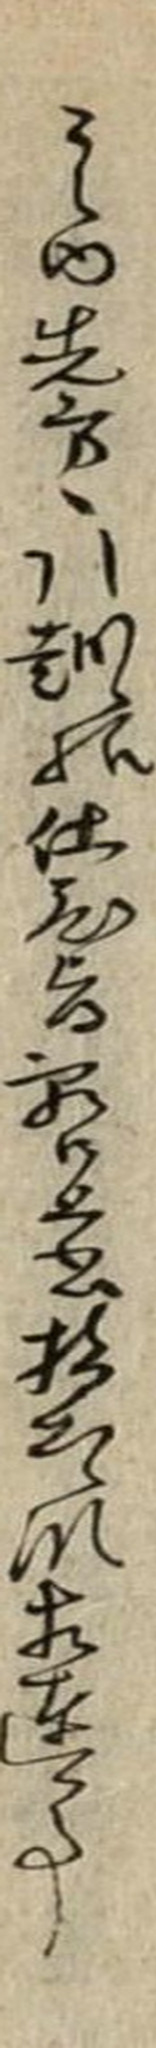々之内先方へ引越候様仕度旨願口上書指出候段相達候事
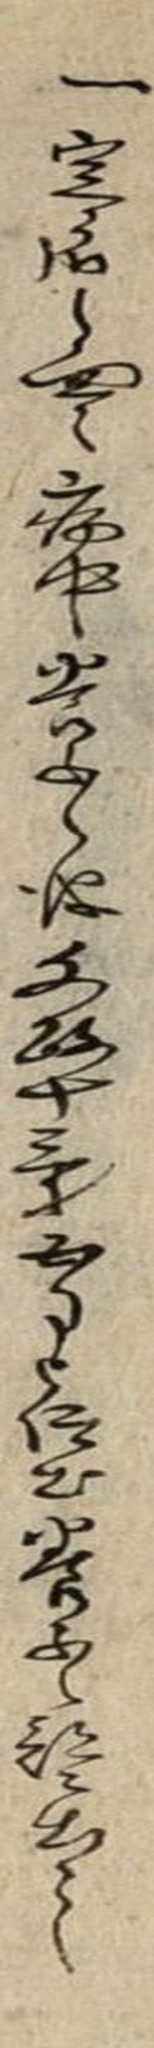一定府之面々病中養子之儀文政十三年五月被仰出養子之部ニ出之
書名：養子縁組之部
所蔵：福井県文書館 Fukui Prefectural Archives
